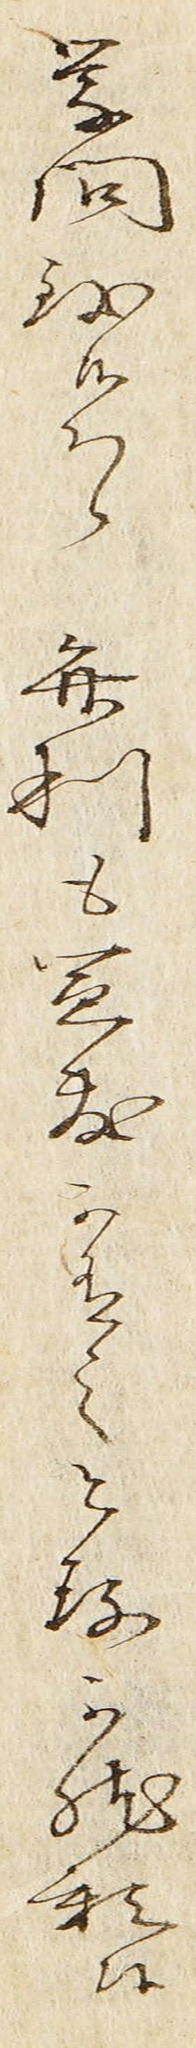学問致候はゝ弁利も宜敷可有之と存可然頼候
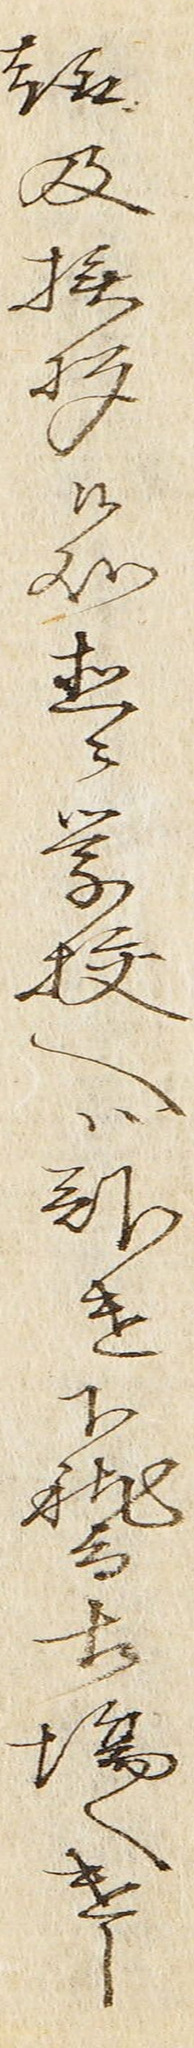趣及挨拶候処直に学校へは難遣下稽古場へ遣し
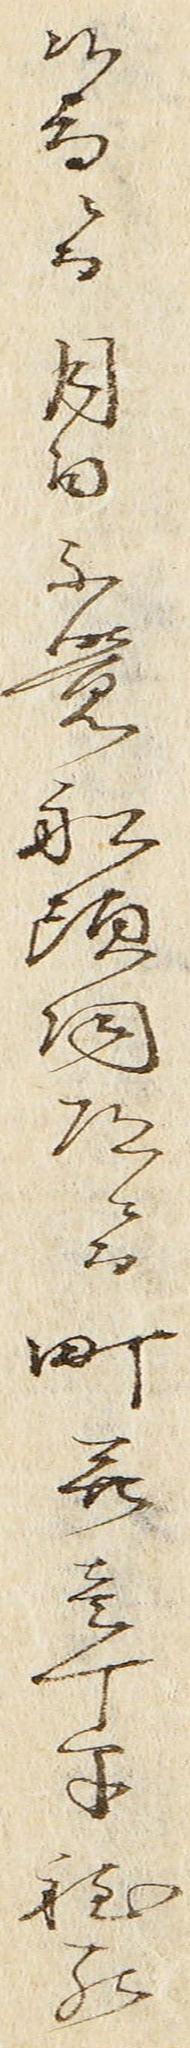候旨に而月日不覚船頭同道に而町并壱丁半程罷
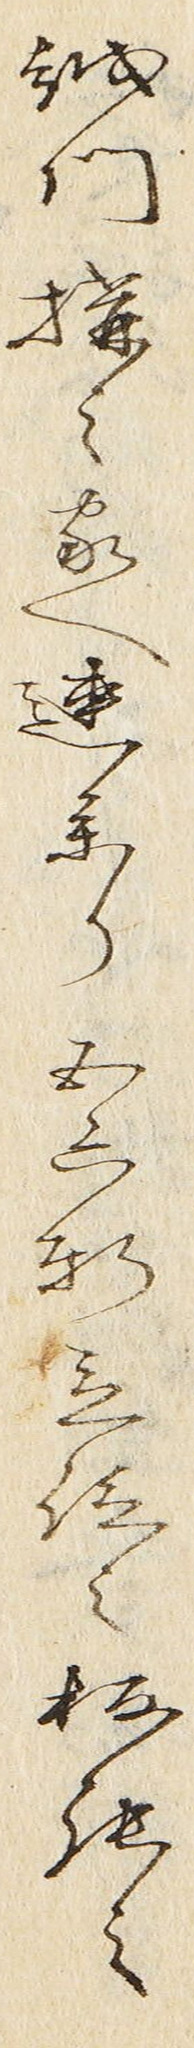越門構之家へ連参り五六軒立位之板張之
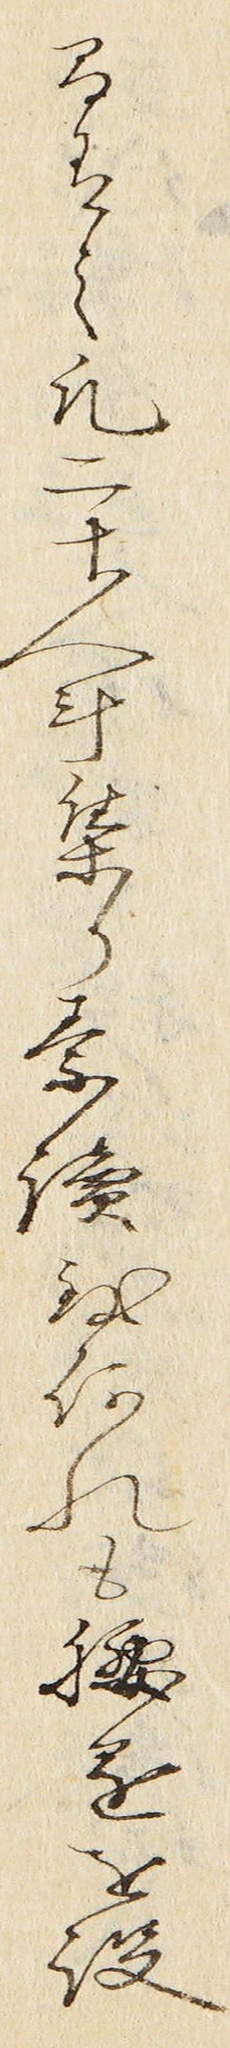間有之凡二十人計集り素読致何れも腰懸を設
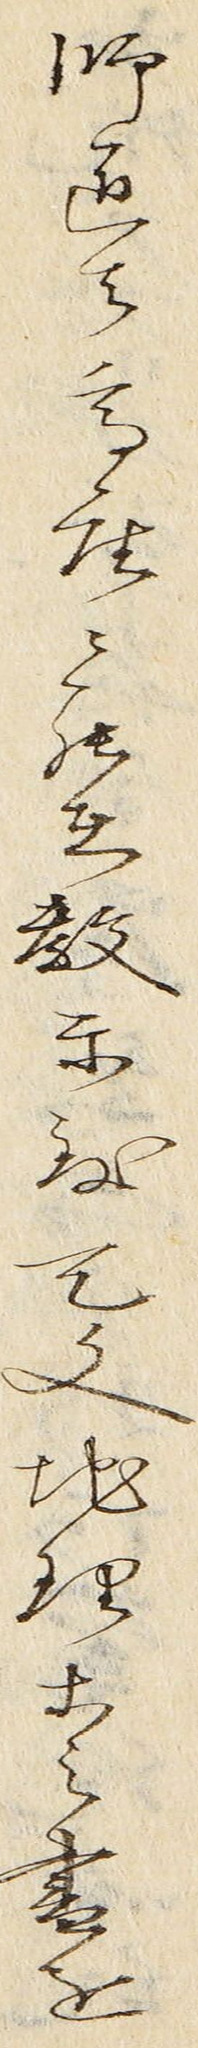師匠は高座に罷在教示致天文地理等之書を
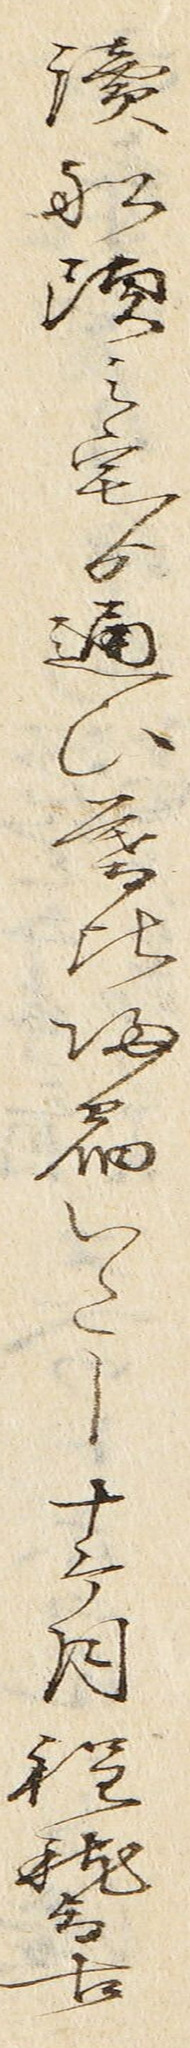読船頭之宅ゟ通ひ暮比帰宿いたし十ヶ月程稽古
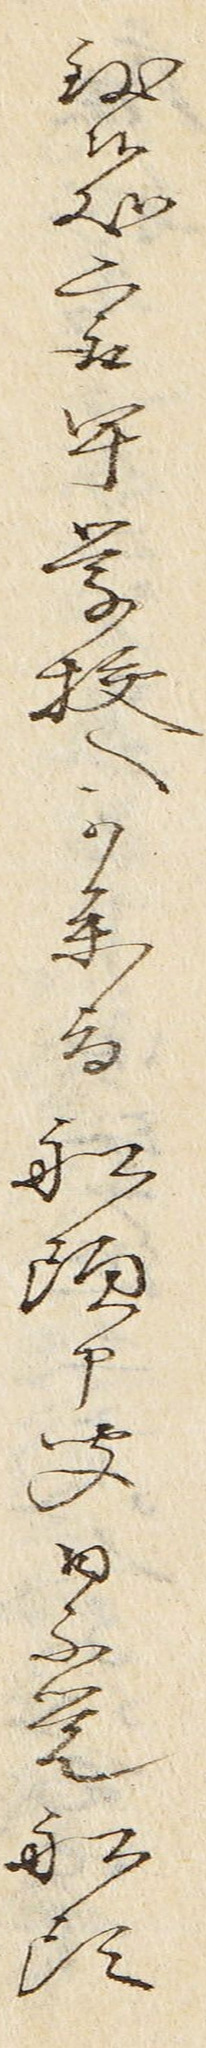致候処最早学校へ可参旨船頭申聞日不覚船頭
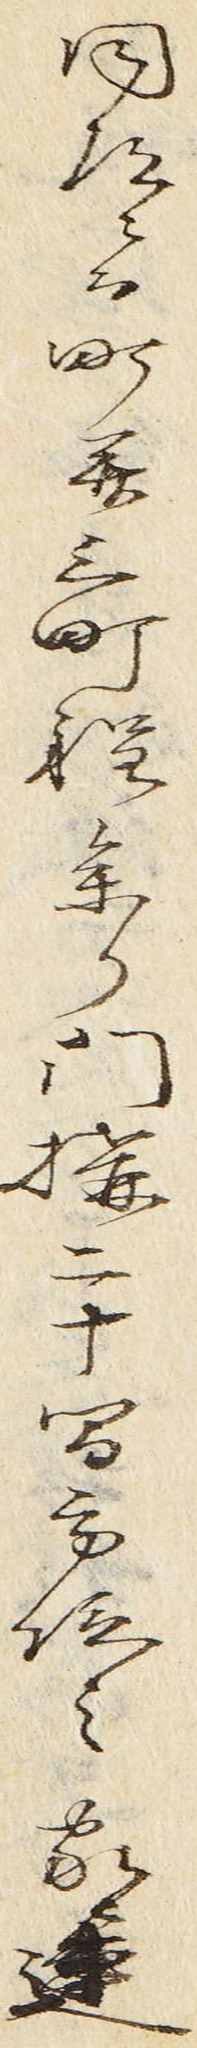同道に而町并三町程参り門構二十間方位之家に連
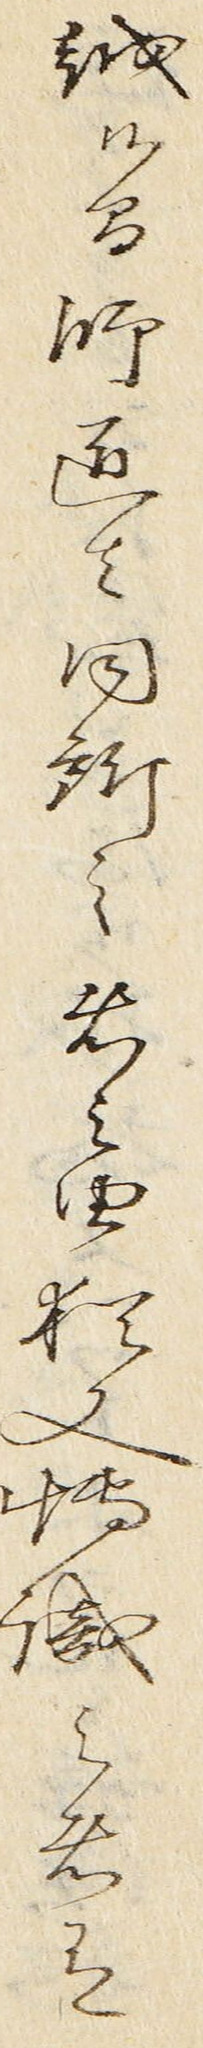越候間師匠は同所之者之由猶又転職之者有
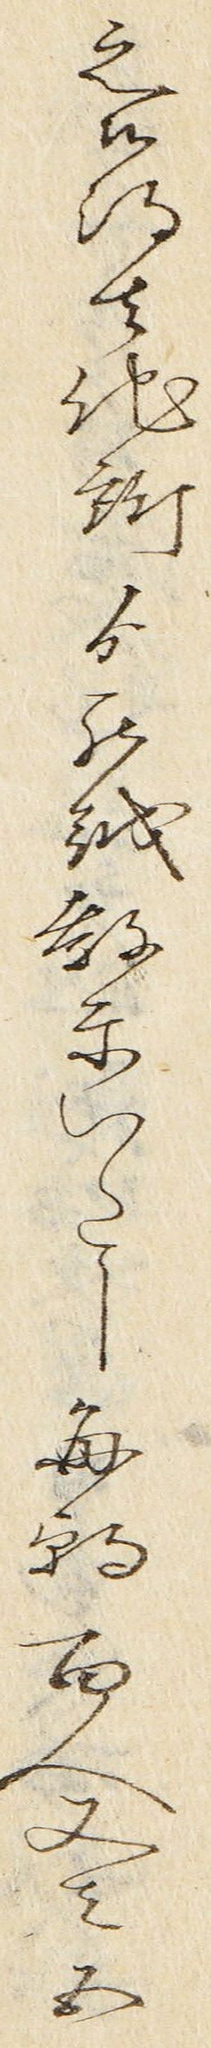之候得は他所ゟ罷越教示いたし毎朝百人又は五
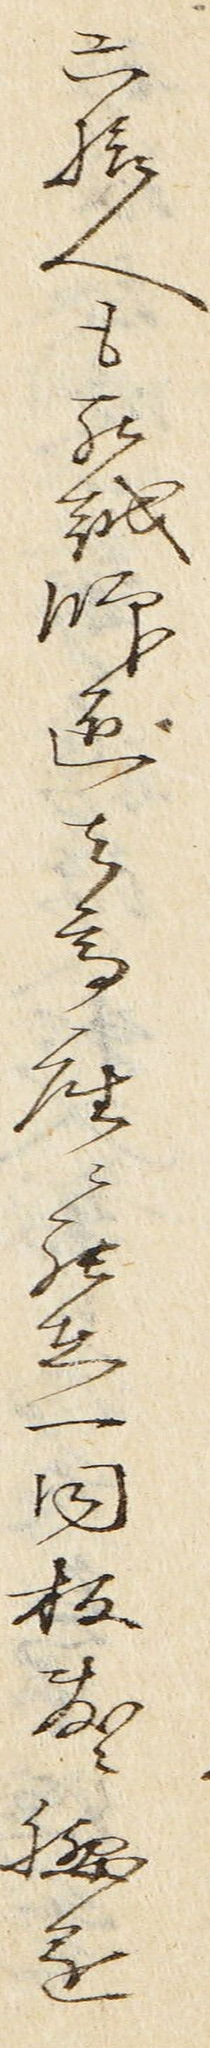六拾人も罷越師匠は高座に罷在一同板敷に腰懸
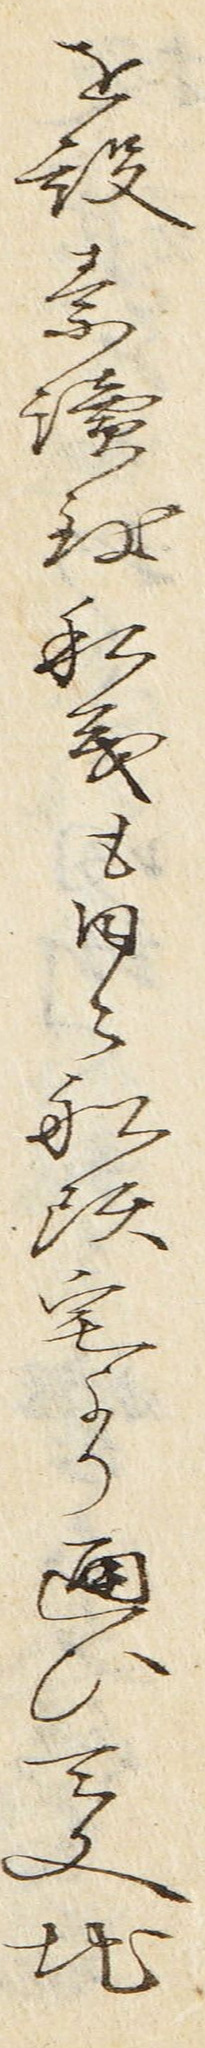を設素読致私義も日々船頭宅より通ひ天文地
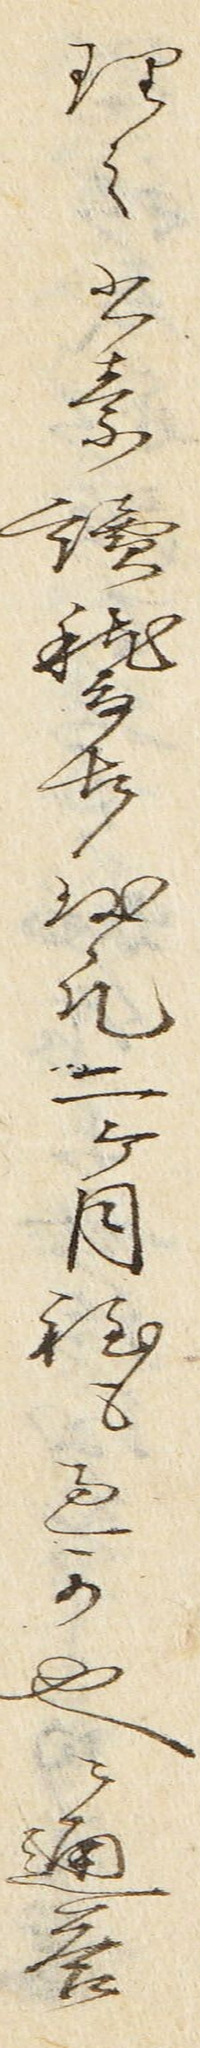理之書素読稽古致凡二ヶ月程も過可也に通答
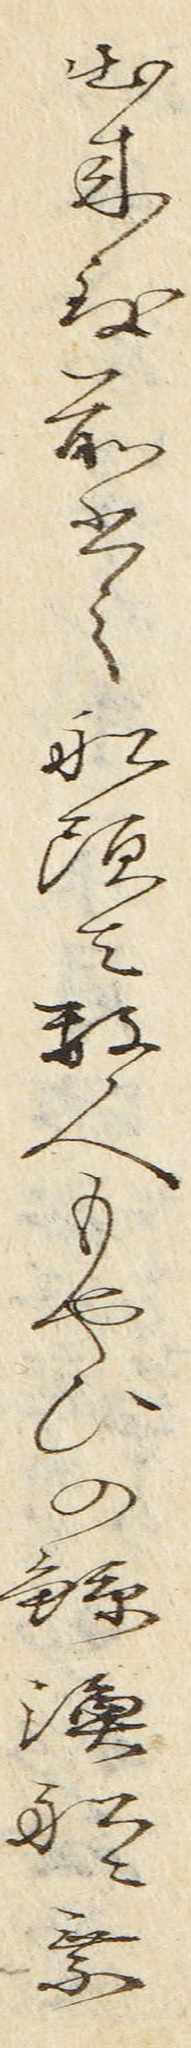出来致前書之船頭は数人もやひの鯨漁船に乗

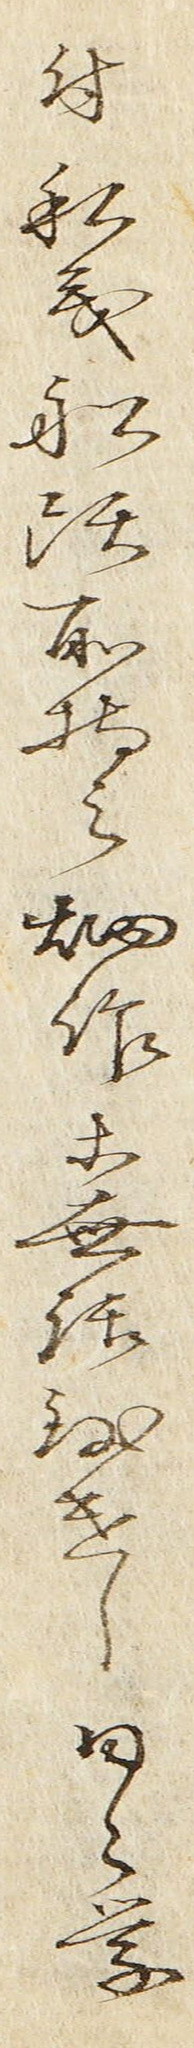付私義船頭所持之畑作相世話致遣し日々学
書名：土佐中浜万次郎漂流記
